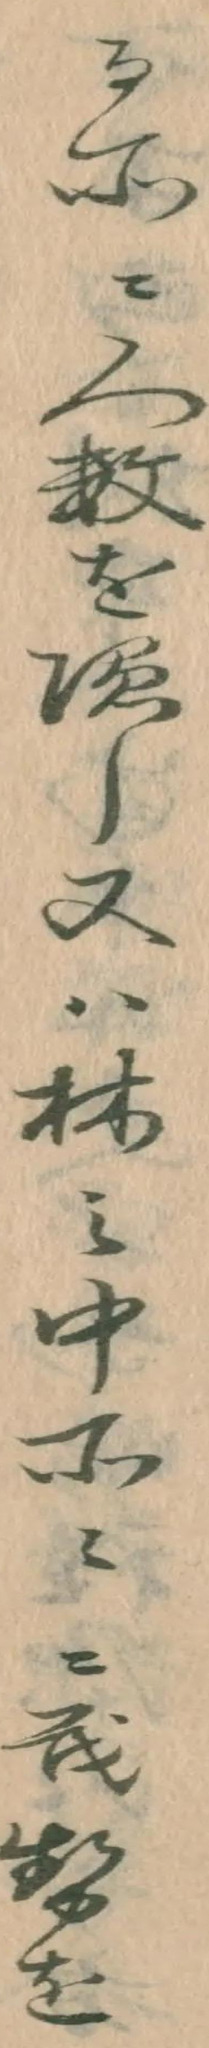る所に人数を隠し又は林之中所々にも勢を
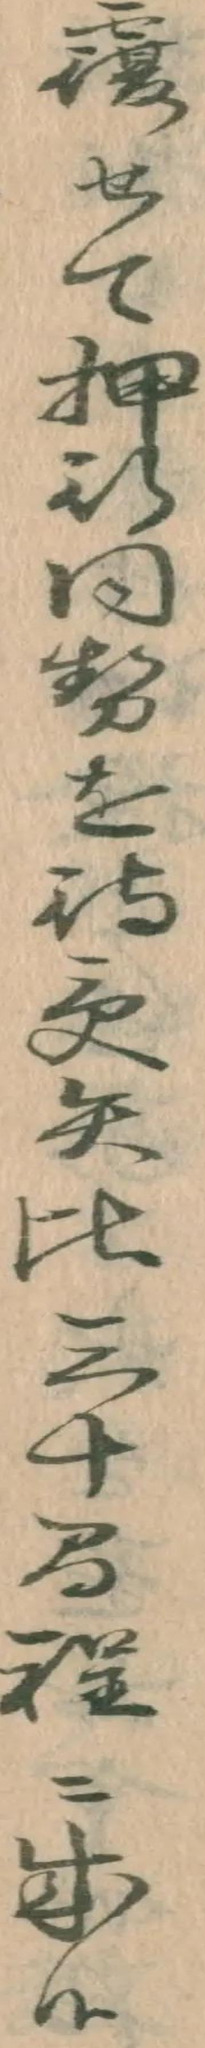覆せて押行同勢を待受矢比三十間程に成候
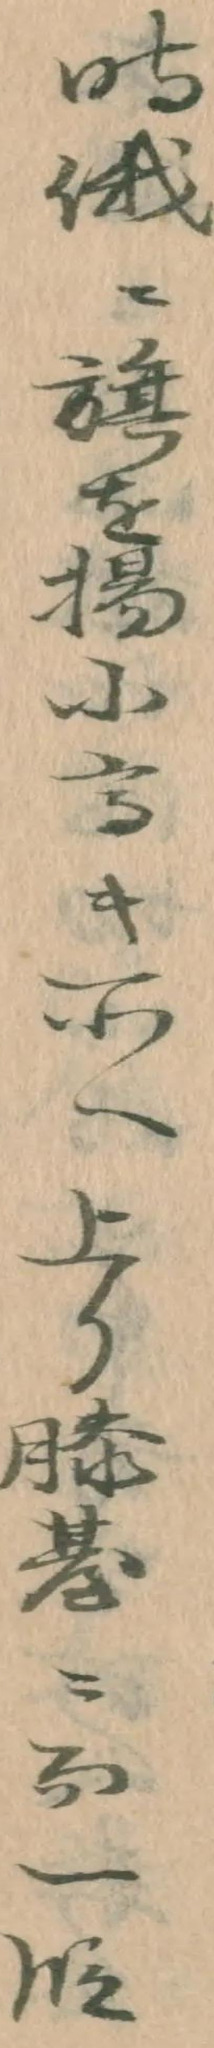時俄に旗を掲小高き所へ上り膝台に而一段
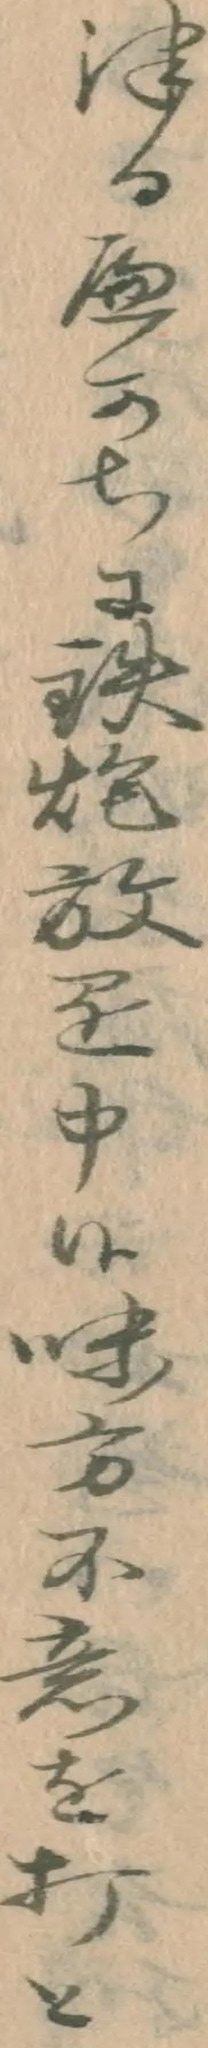つるへかちに鉄炮放懸申候味方不意を打と
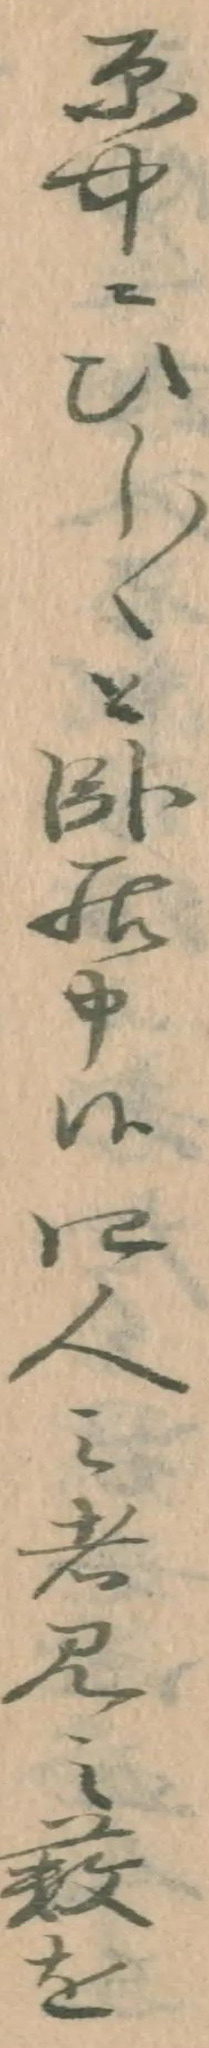原中にひし〱と臥居申候四人之者見之薮を
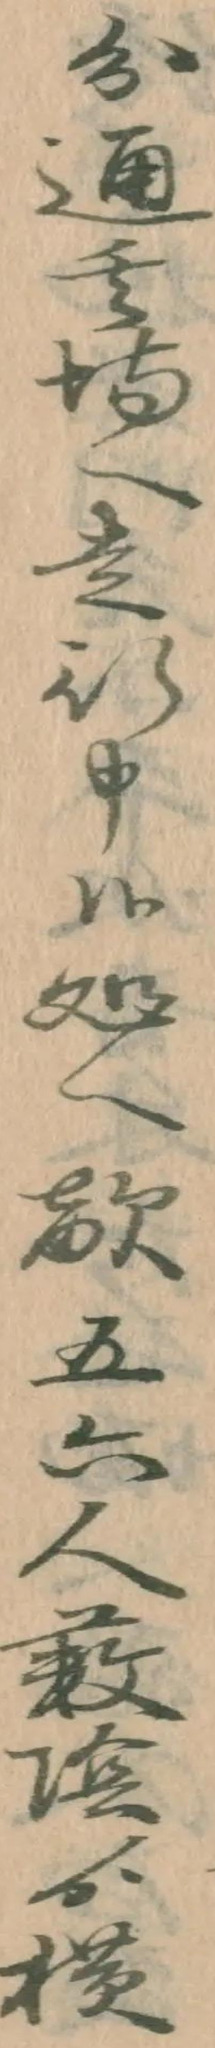分通其場へ走行申候処へ敵五六人薮陰ゟ横
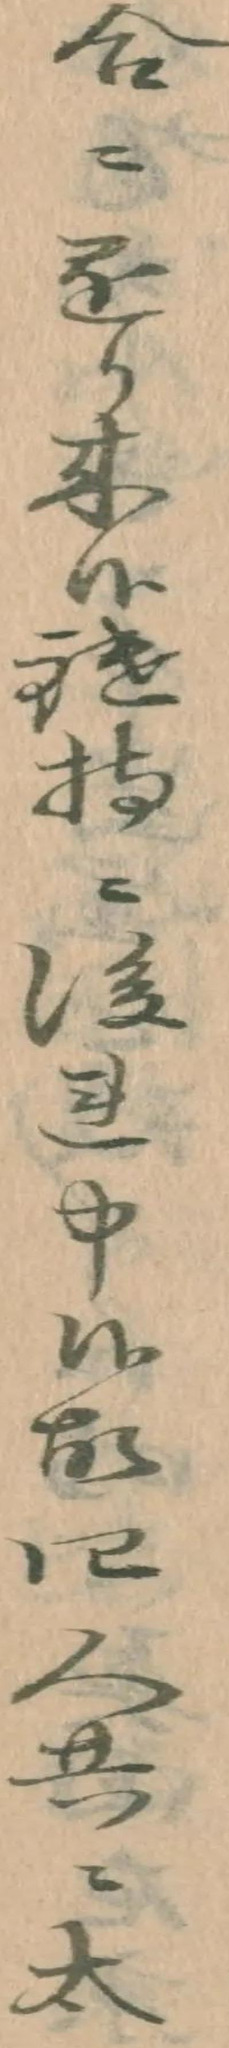合に懸り来候鑓持に後れ申候故四人共に太
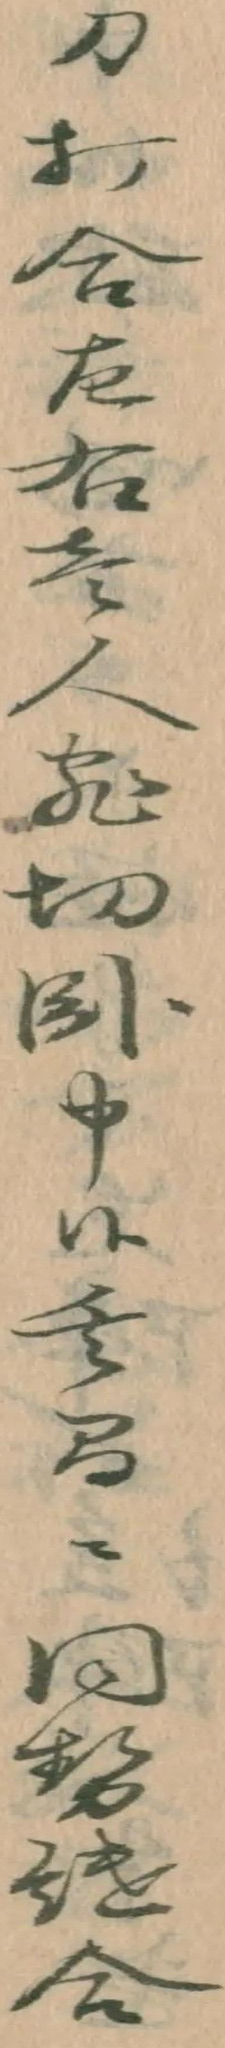刀打合左右壱人宛切臥申候其間に同勢鑓合
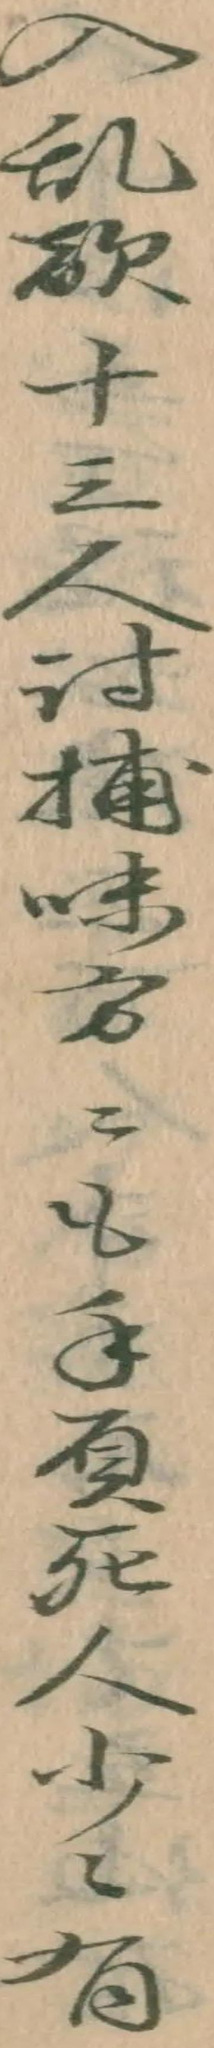入乱敵十三人打捕味方にも手負死人少々有
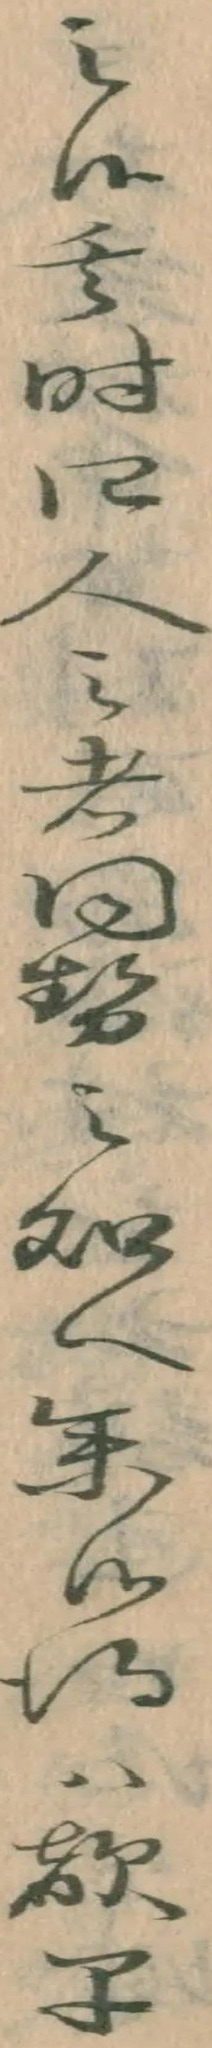之候其時四人之者同勢之処へ参候得は敵早
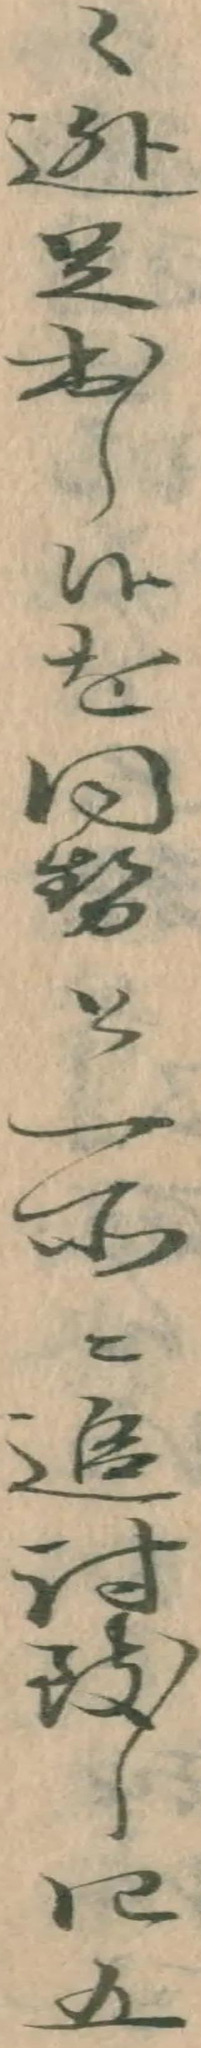く逃足出し候を同勢と一所に追討致し四五
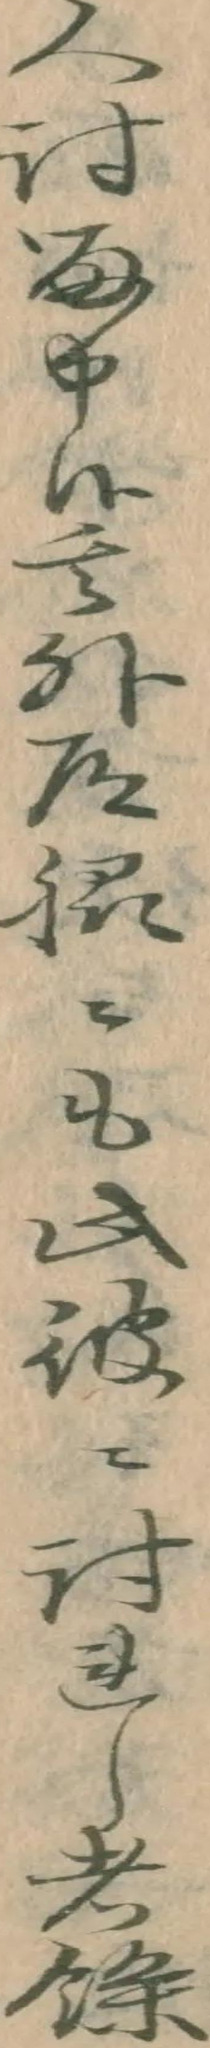人討留申候其外道脇にも此彼に討れし者余
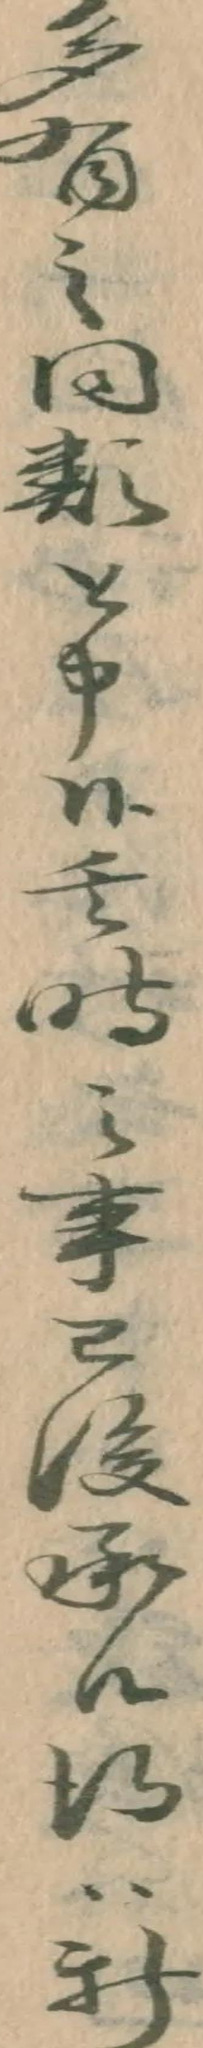多有之同類と申候其時之事以已後承候得は新
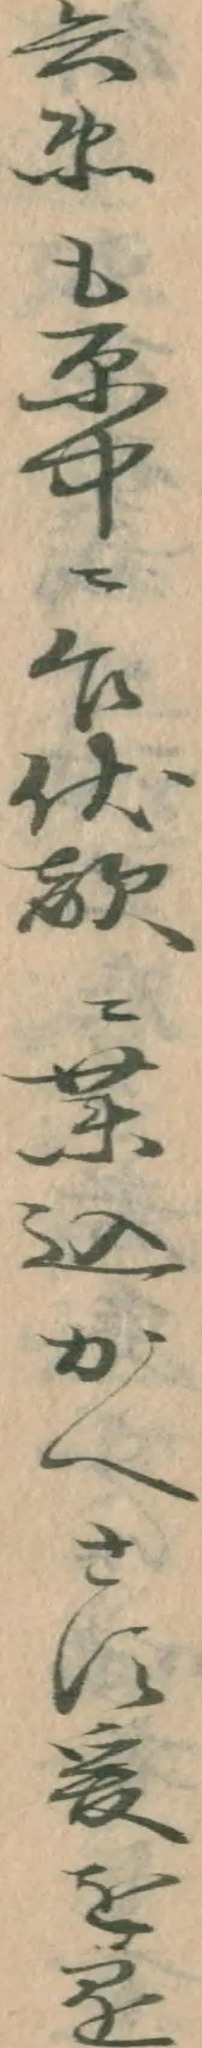兵衛も原中に乍伏敵に薬込かへさす爰を懸
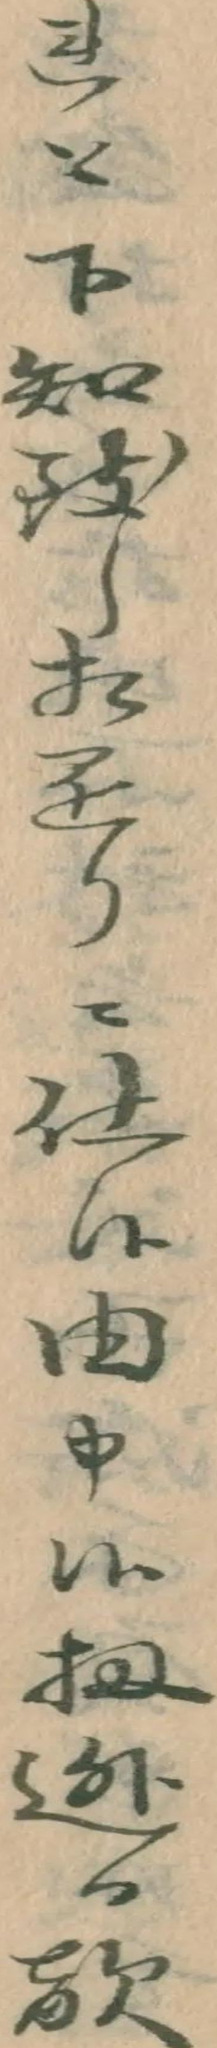れと下知致し相懸りに仕候由申候扨逃る敵
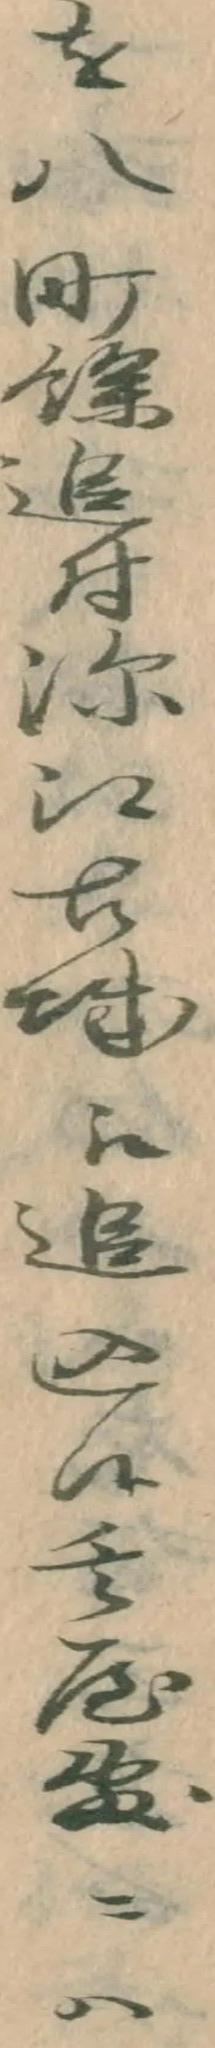を八町余追付深江古城え追込候其屋敷には
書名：切支丹御退治記 49巻. [1]
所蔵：国立国会図書館 National Diet Library, JAPAN
